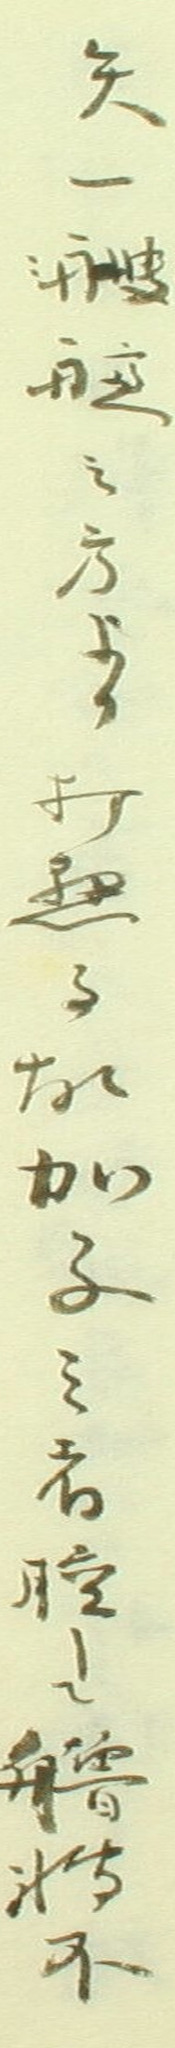矢一艘？之方より打懸る故加子之者臆して艪？不
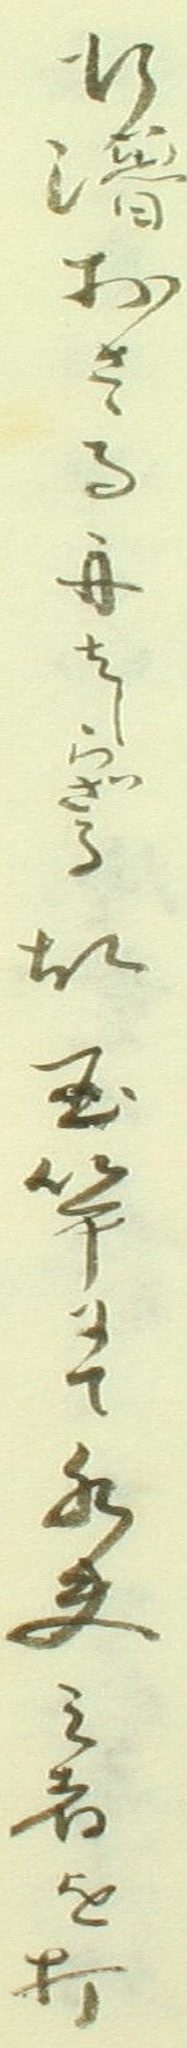行艪おささる舟はしらざる故玉竿にて水夫之者を打
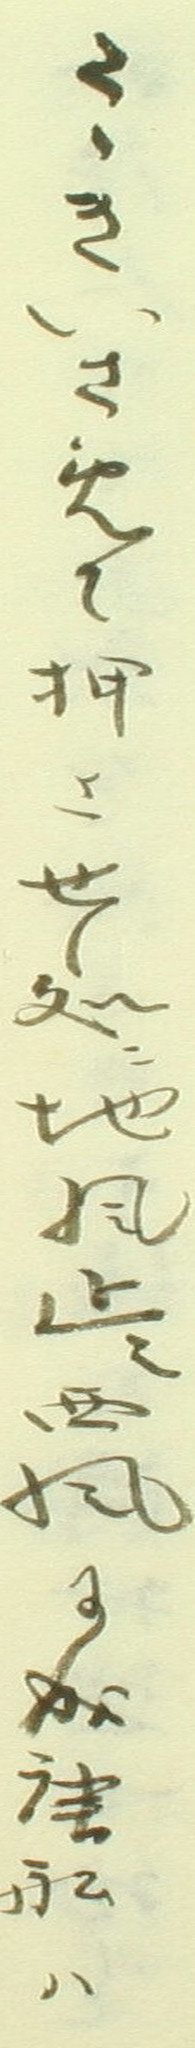たたきいさめて押させし処に地風止み西風に成唐船は
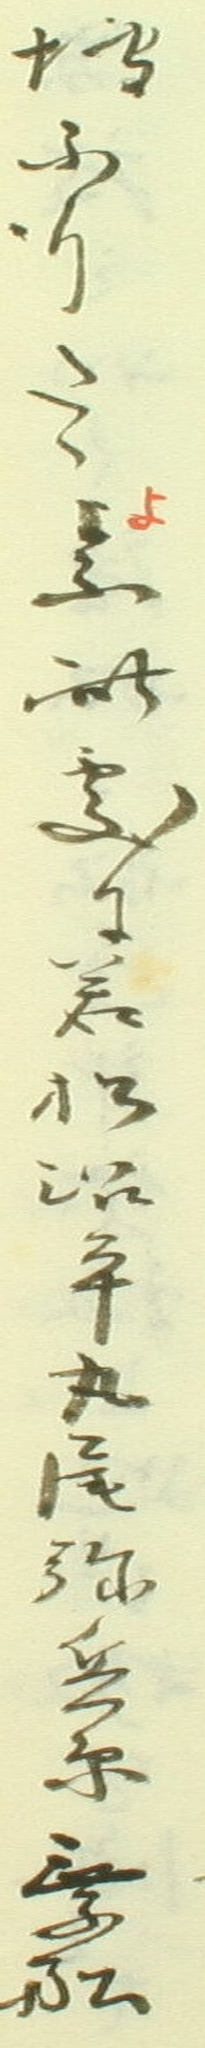増ふりたたよふ此處に若松治平丸尾弥兵衛乗船
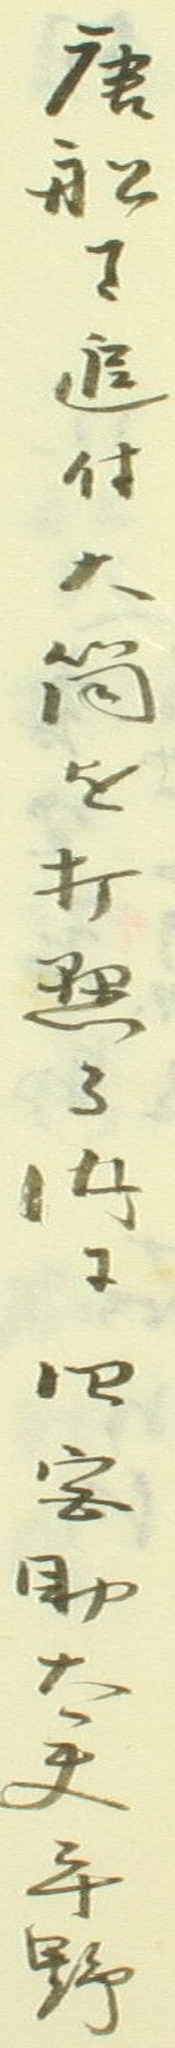唐船に追付大筒を打懸る内に四宮助太夫平野
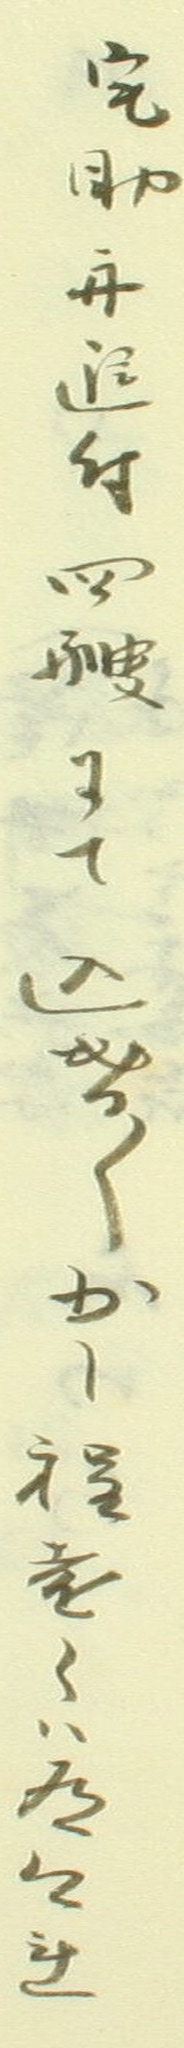宅助舟追付四艘にて込替込替少し程遠くは有けれ
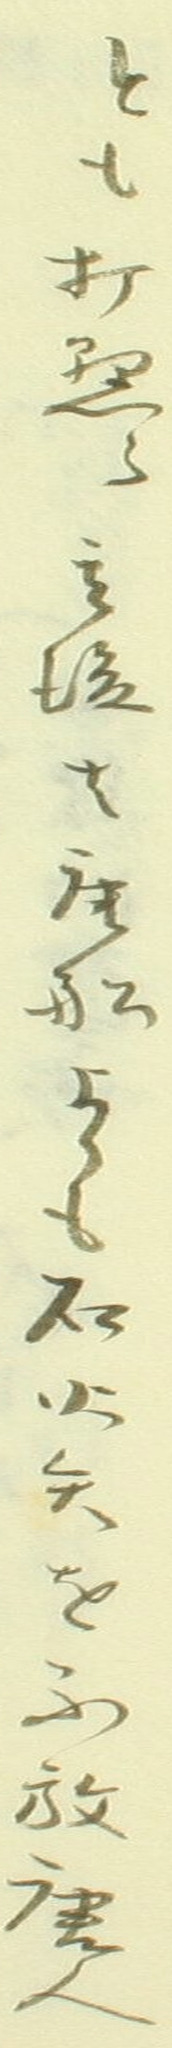とも打懸る其後は唐船よりも石火矢を不放唐人
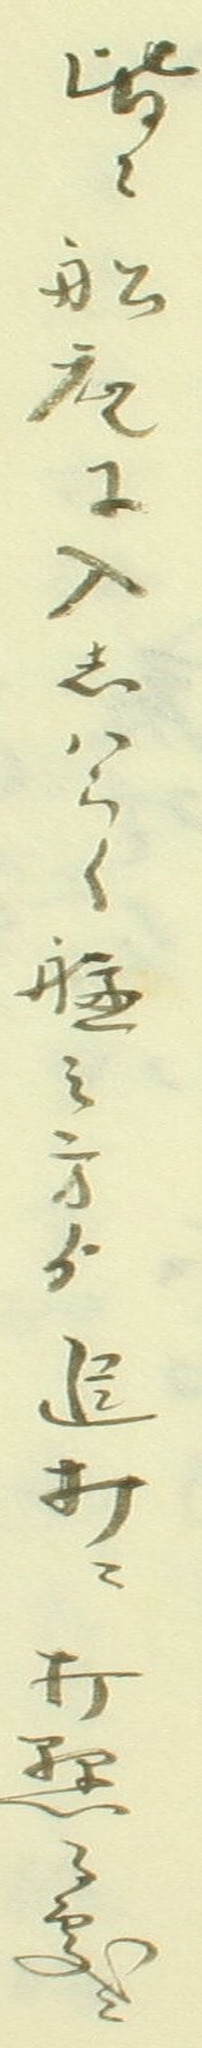皆々船底に入しはらく？之方ゟ追打に打懸る處に
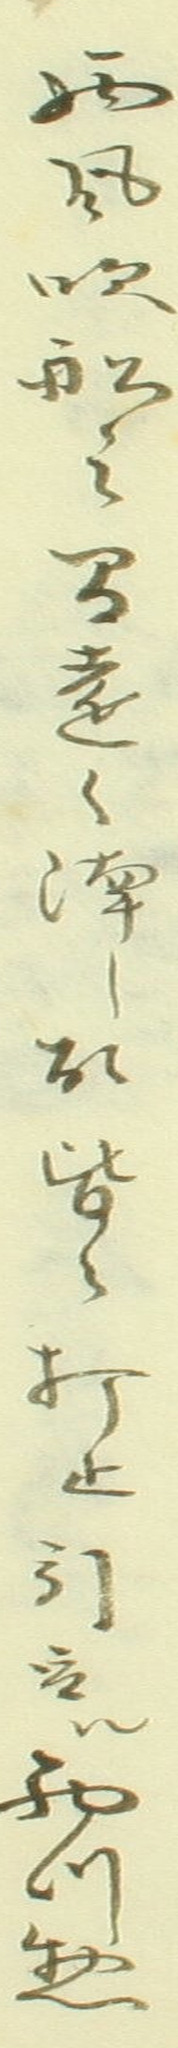西風吹船之間遠く漂し故皆々打止引取る西川惣
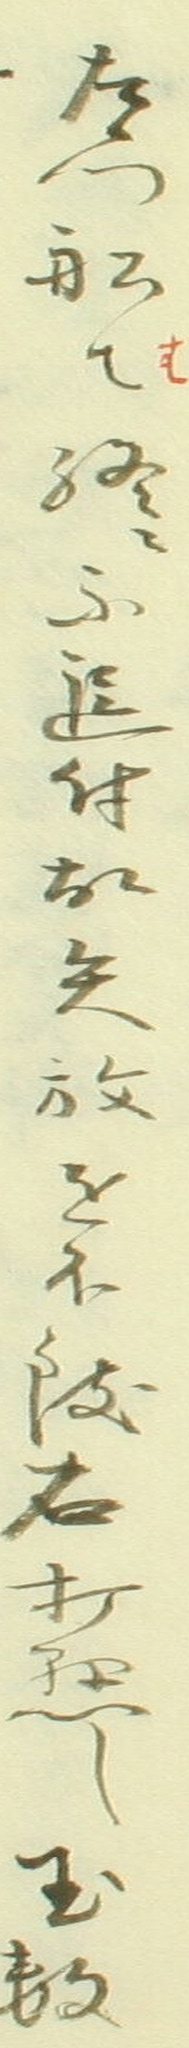左衛門船て終に不追付故矢放を不致右打懸し玉数
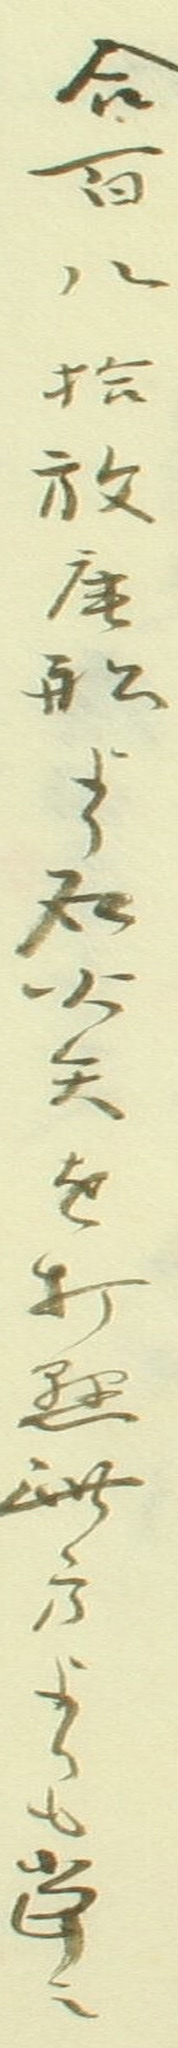合百八拾放唐船より石火矢を打懸此方よりも当之
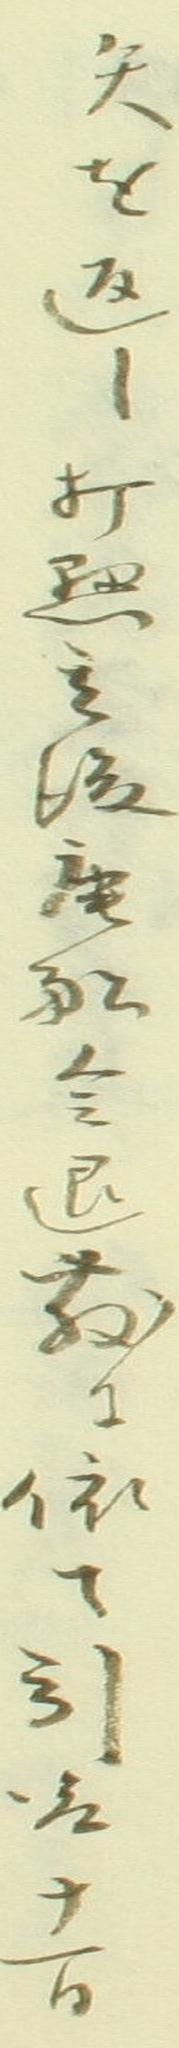矢を返し打懸其後唐船今退處に依て引取十一日
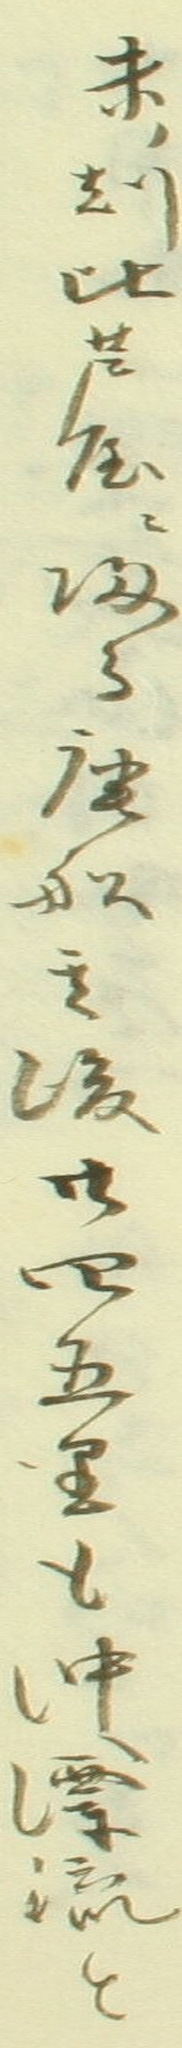未の刻頃芦屋に帰る唐船其後廿四五里も沖へ漂流と
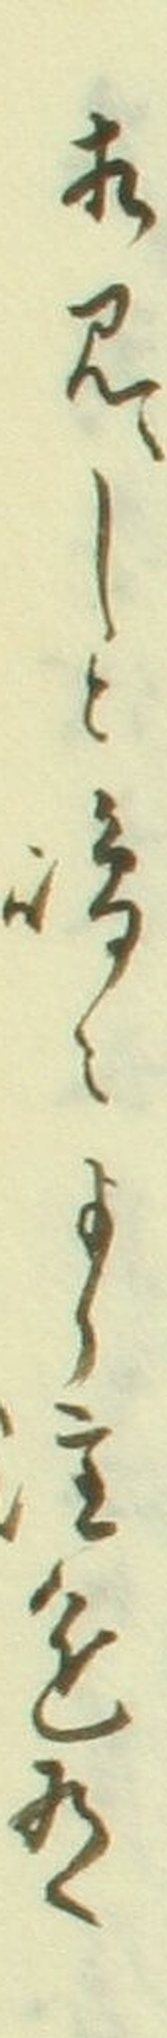相見へしと嶋嶋より注進有

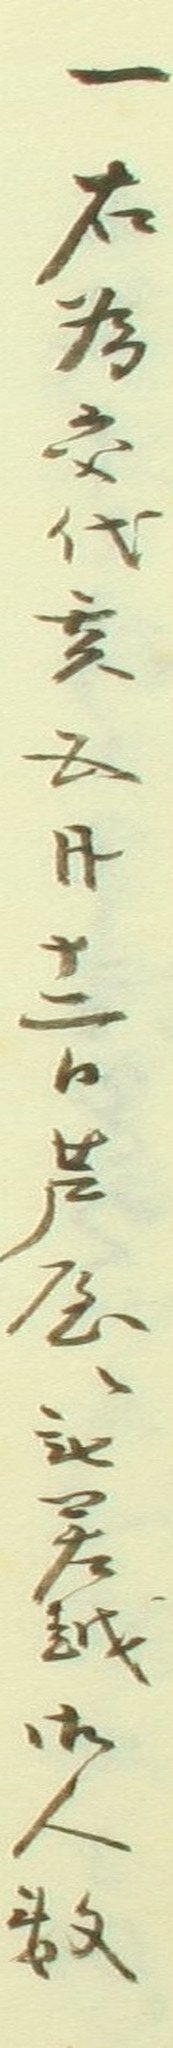一右為交代亥五月十二日芦屋へ被差越御人数
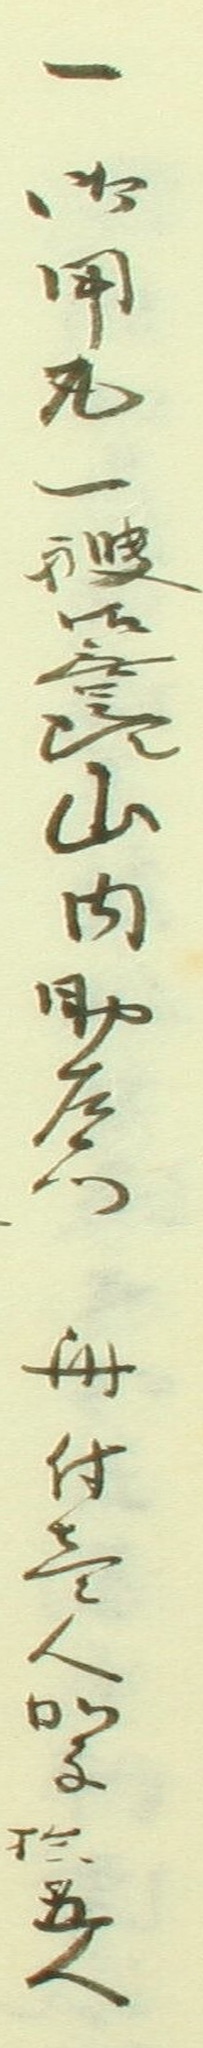一御用丸一艘御無足頭山内助左衛門舟付壱人加子拾五人
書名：唐船漂流記 三
